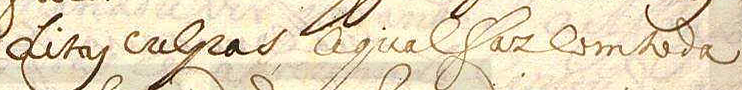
ditas culpas, a qual faz com toda
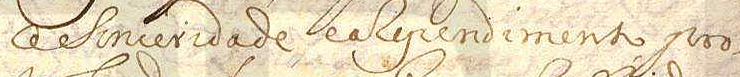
a Sinceridade, e aRependimento pro
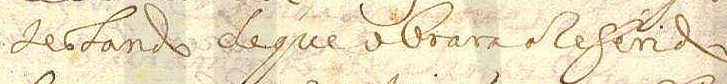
testando de que obrara o Referido
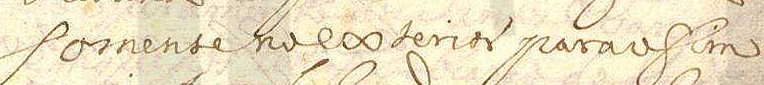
somente no exterior para o fim
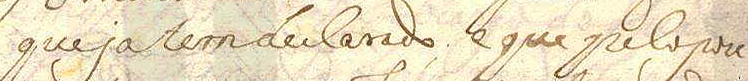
que ja tem declarado; e que pelo pou
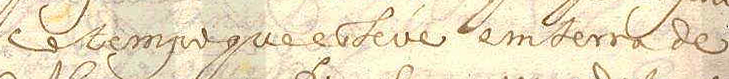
co tempo que esteve em terra de
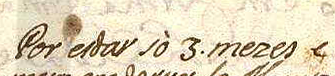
Por estar só 3. mezes e
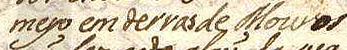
meyo em terras de Mouros
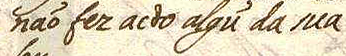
naõ fez acto algū da sua
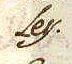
Ley.
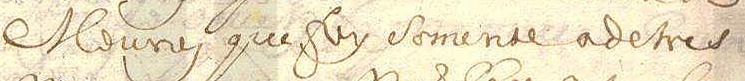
Mouros que foy somente a de tres
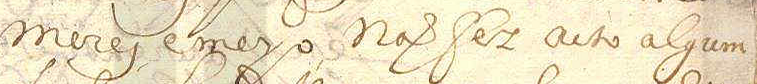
mezes, e meyo, naõ fez acto algum
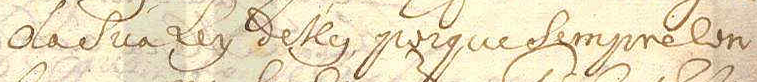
da sua Ley delles, porque sempre con
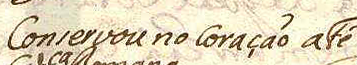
Conservou no coraçaõ a Fé
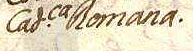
Cat.ca Romana.
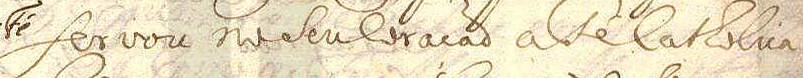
servou no seu Coraçaõ a Fé Catholica
